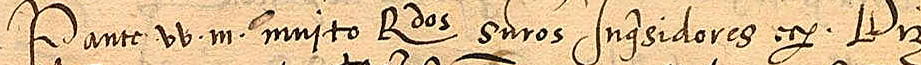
Ꝑante .vv.m. mujto Rdos Snr̄os Jnqisidores ccꝭ. Diz
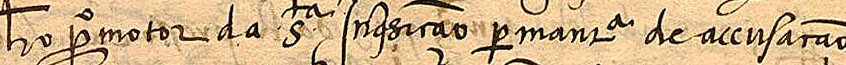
ho ꝓomotor da .S.ta Jnq̄sição ꝑ manra de accusação
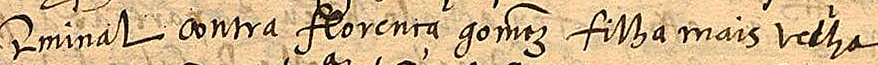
CriminaL contra florença gomez filha mais velha
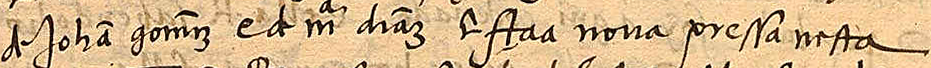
de Johā gomez e de ma diaz cistaa noua pressa nesta
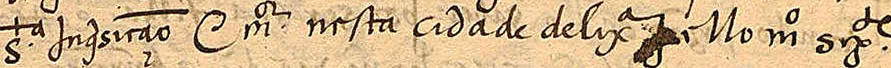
S.ta Jnqisição e mor nesta cidade de lixa pello mo segte.
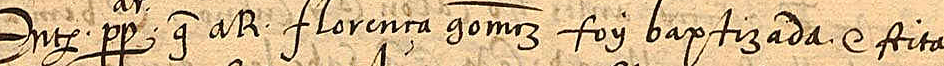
Entꝭ. ꝑꝑar. q̄ a R. florença gomez foy baptizada e feita
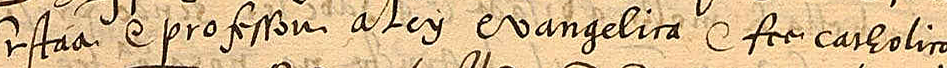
cistaa e professou a Ley evangelica e fee catholiça
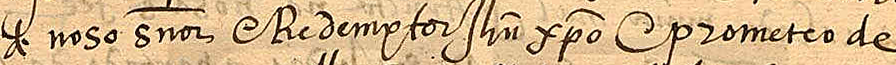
de noso s̄nor e Redemptor Jhū xp̄o e prometeo de
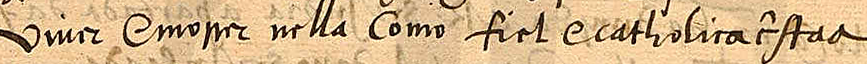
viuer e morrer nella Como fiel e catholica cistaa
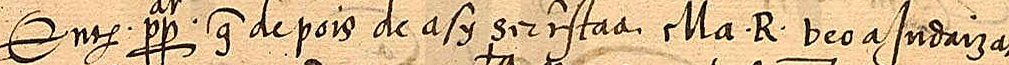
Entꝭ .ꝑꝑar. q̄ depois de asy ser cistaa ella .R. veo a Judaizar
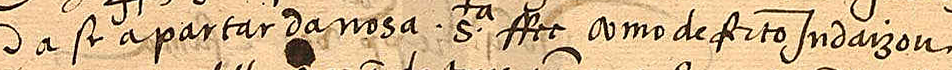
e a se apartar da nosa .S.ta ffee como de feito Judaizou
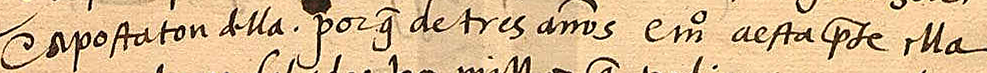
e apostatou della. porq̄ de tres an̄os e mo a esta p̄te ella
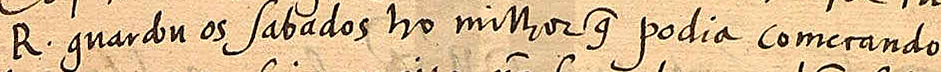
R. guardou os Sabados ho milhor q̄ podia comecando
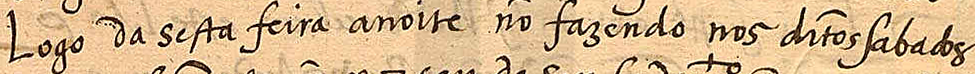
Logo da sesta feira a noite nō fazendo nos ditos Sabados
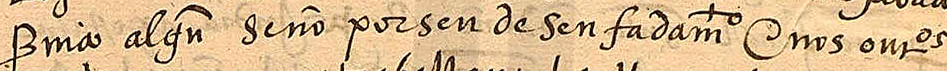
ꞩuiço algū senō por seu desenfadamto e nos outos
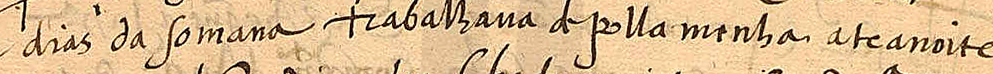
dias da Somana trabalhaua de polla menha ate a noite
